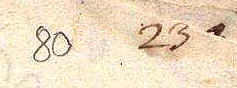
23
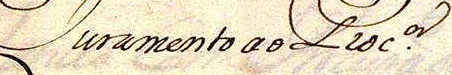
Iuramento ao Proc.or
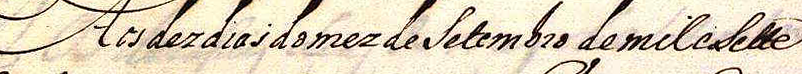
Aos dez dias do mez de Setembro de mil e Sette
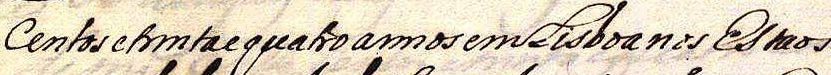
Centos e trinta e quatro annos em Lisboa nos Estaos
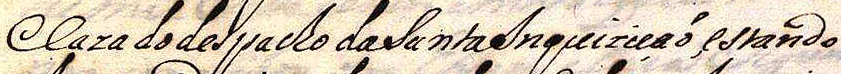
E Caza do despacho da Santa Inquiziçaõ, estando
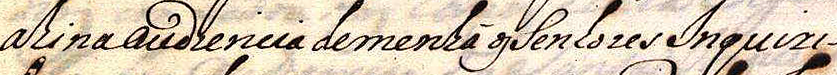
ahi na audiencia de menhã os senhores Inquizi
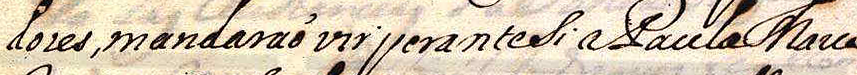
dores, mandaraõ vir perante Si a Paula Maria
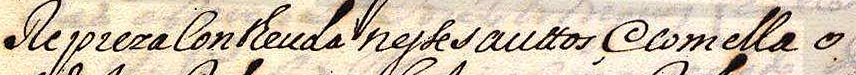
Re preza Contheuda nesses auttos, e com ella o
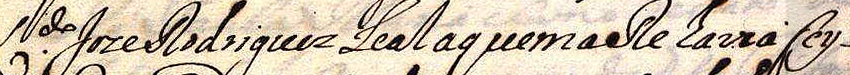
L.do Joze Rodriguez Leal a quem a Re havia fey
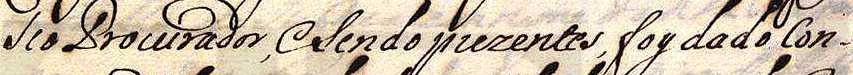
seo Procurador, E Sendo prezentes, foy dado con
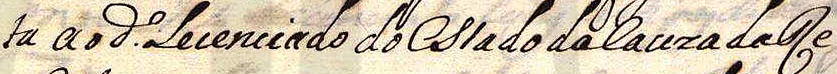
ta ao d.o Lecenciado do estado da Cauza da Re
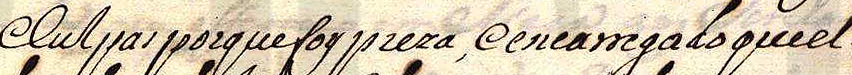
E Culpas porque foy preza, e encarregado que el
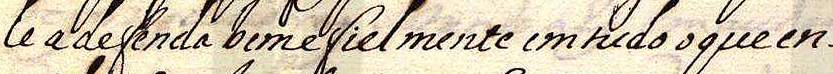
le a defenda bem e fielmente em tudo o que en
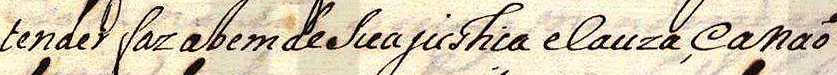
tender faz a bem de sua justiça e Cauza, E a naõ
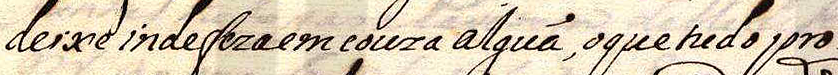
deixe indefeza em couza alguā, o que tudo pro
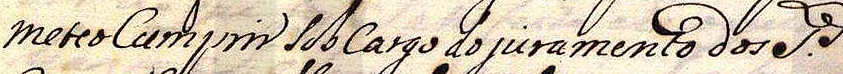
meteo Cumprir sob cargo do juramento dos s.tos
